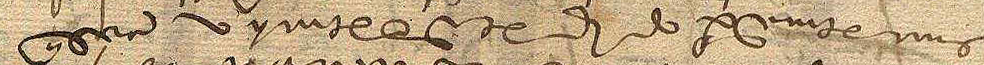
q̄ serā vymte e sete dj do ꝑsemte mes
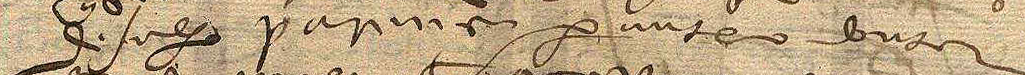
de Julho parecese ꝑante o doutor
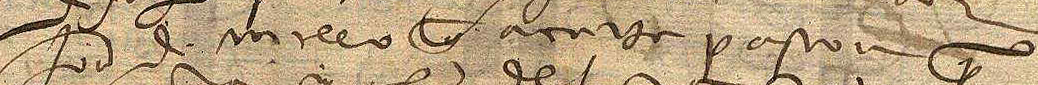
Joā de mello q̄ a carta passou p̄o
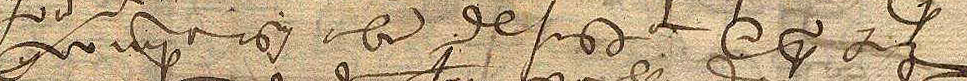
q̄ comp̄a asy a bē de Justa e p̄o ter
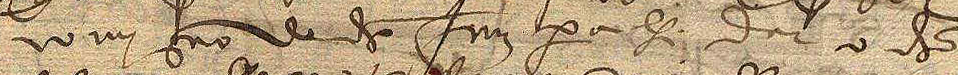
comjsão do dto Juiz ꝑa lhe dar o dto
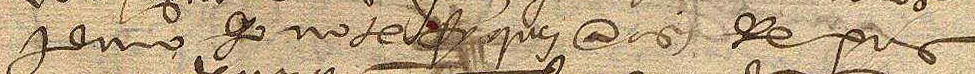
termo ho notefyquej e asy lhe pus
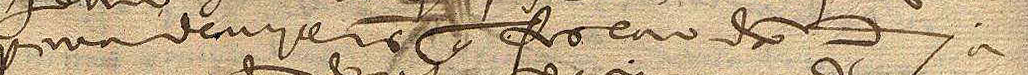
pena de mjll r̄s q̄ fose ao dtō dja
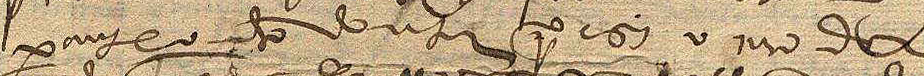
ꝑante o dto doutor p̄o asy o mādar
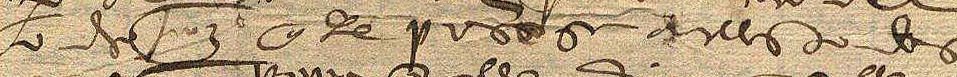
to dto Juiz q̄ lhe posese a elles todos
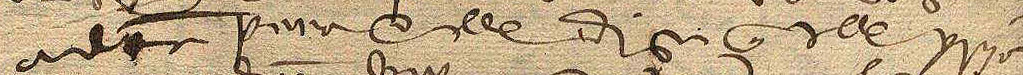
a dta pena e elle djse q̄ elle yrya
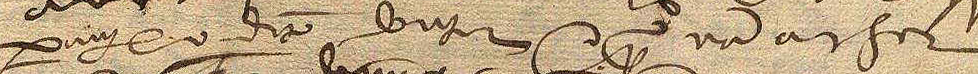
ꝑante o dito doutor e p̄o nā achar
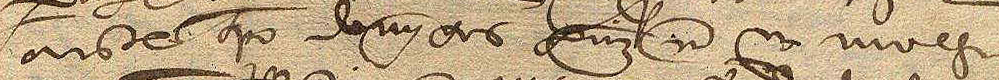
a este tp̄o domj̄gos gomez nē sua molher
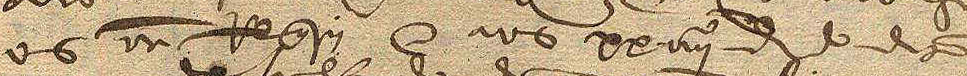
os nā Req̄ry e aos xxiiijo di do dito
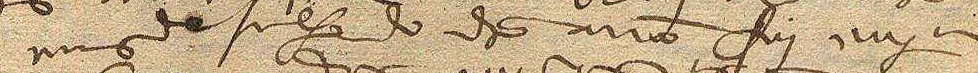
mes de Julho do dtō anō fuy eu tam
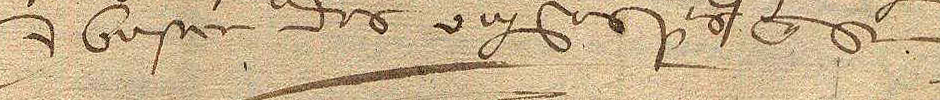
ē busca das outras pas q̄ se
